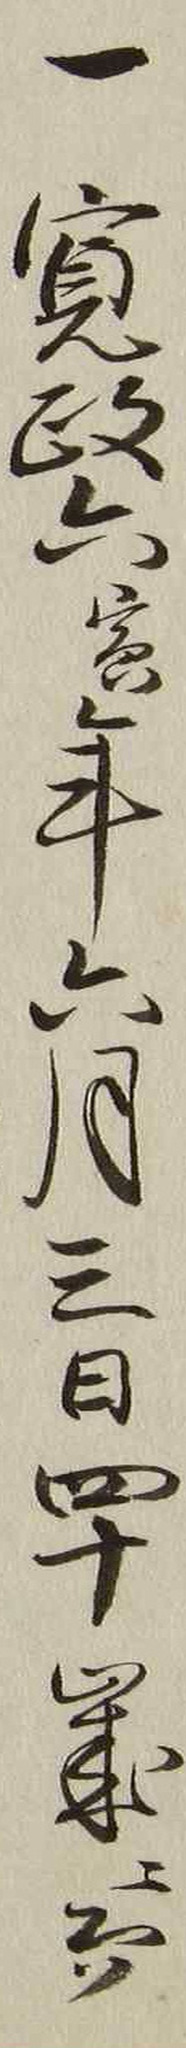一寛政六寅年六月三日四十歳ニ而
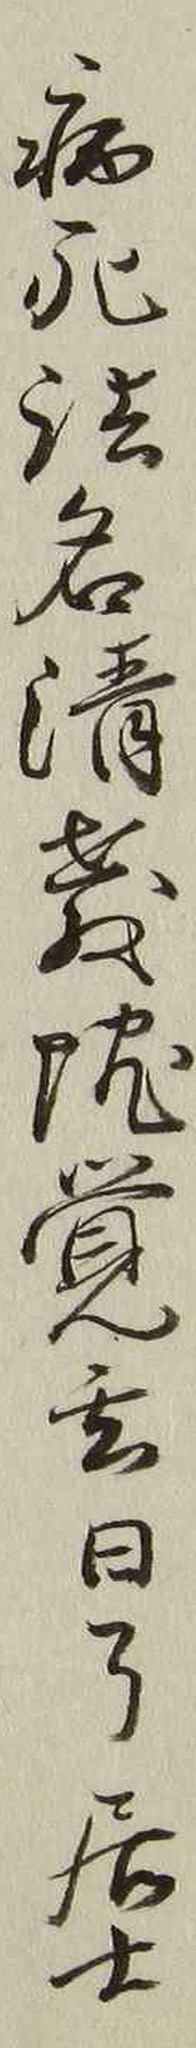病死法名清教院覚玄日了居士
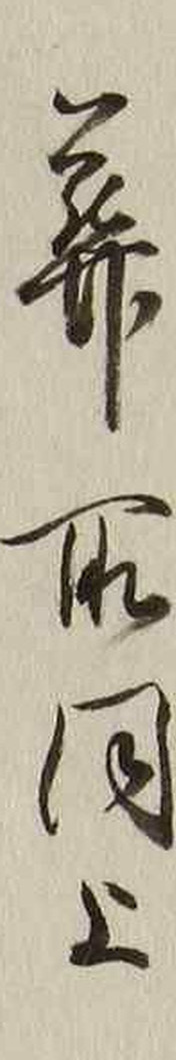葬所同上
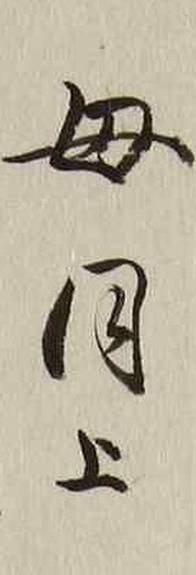母同上
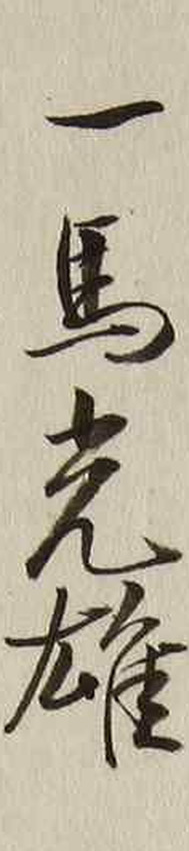一馬光雄
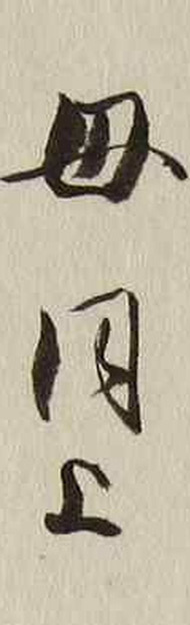母同上
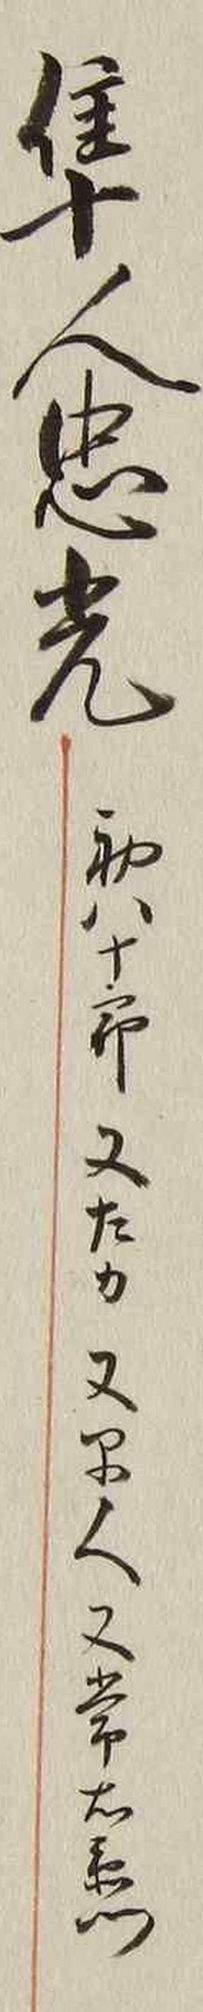隼人忠光初八十郎又左力又早人又常右衛門
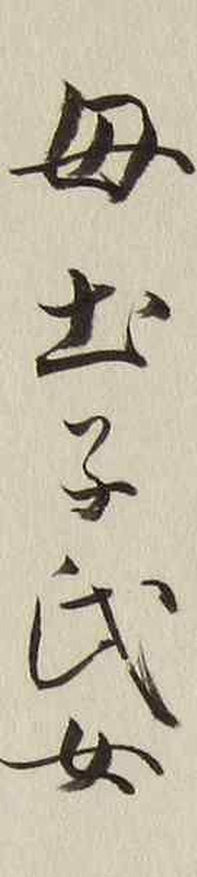母土子氏女
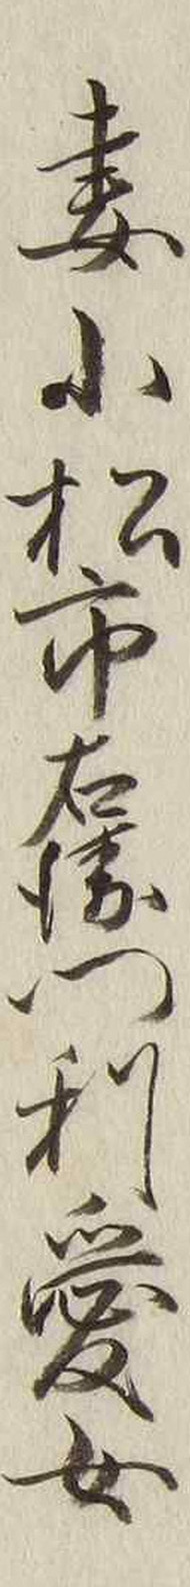妻小松市右衛門利愛女

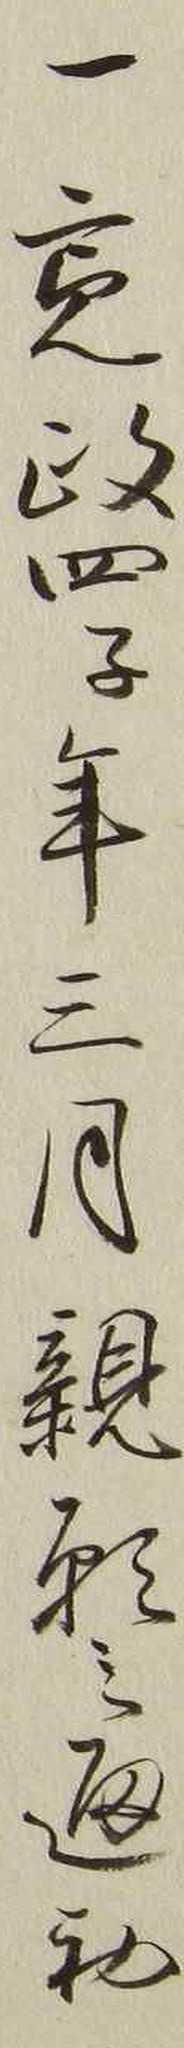一寛政四子年三月親願之通初
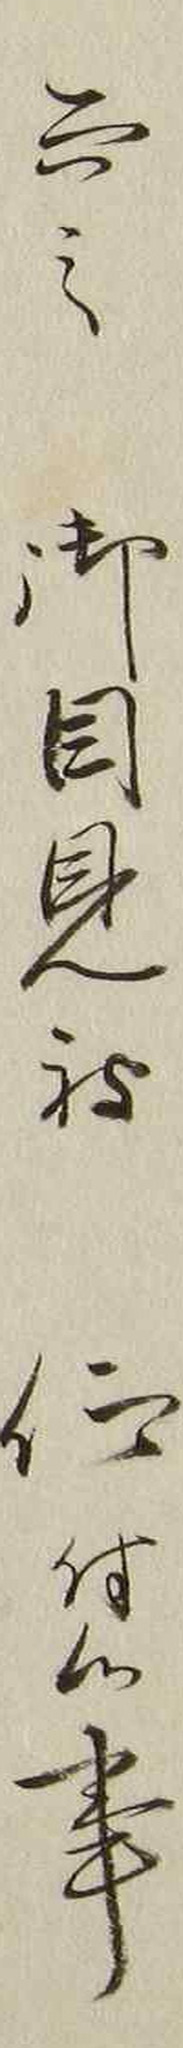而之御目見被仰付候事
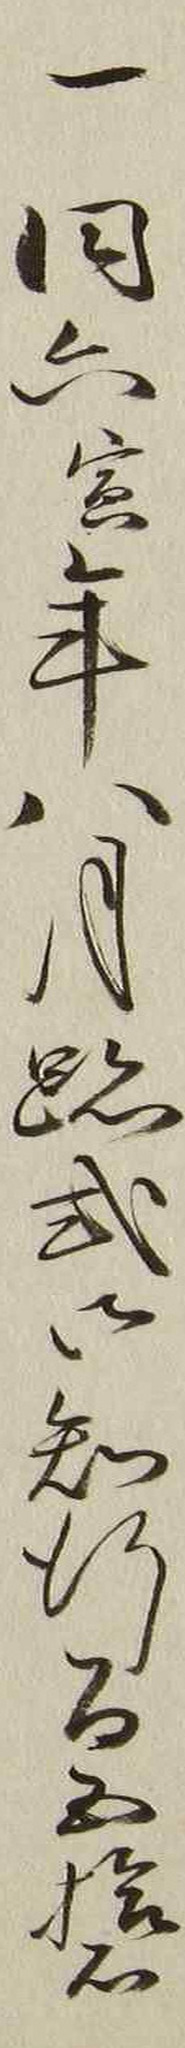一同六寅年八月跡式御知行百五拾石
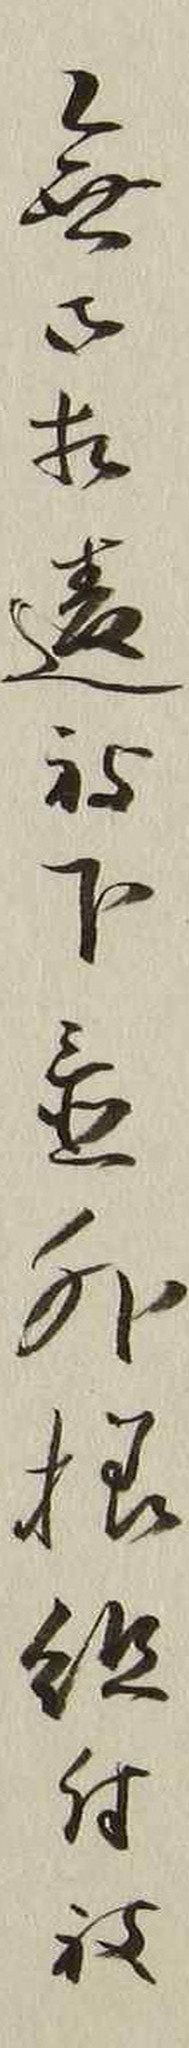無御相違被下置外様組付被
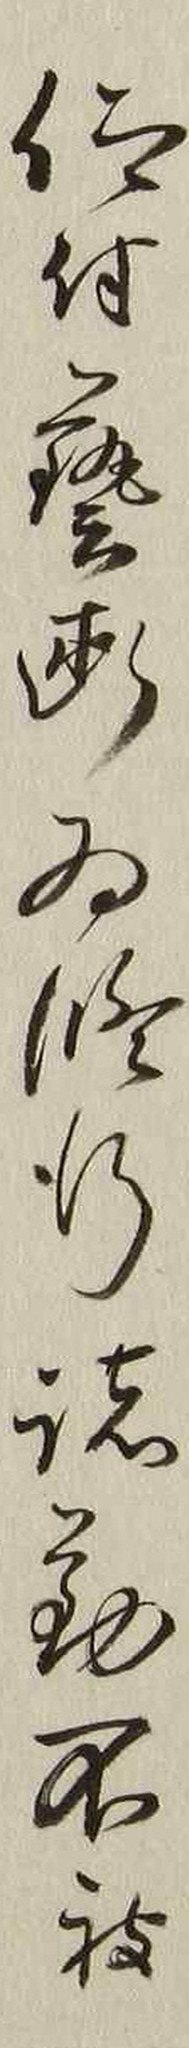仰付芸術為修行諸勤不被
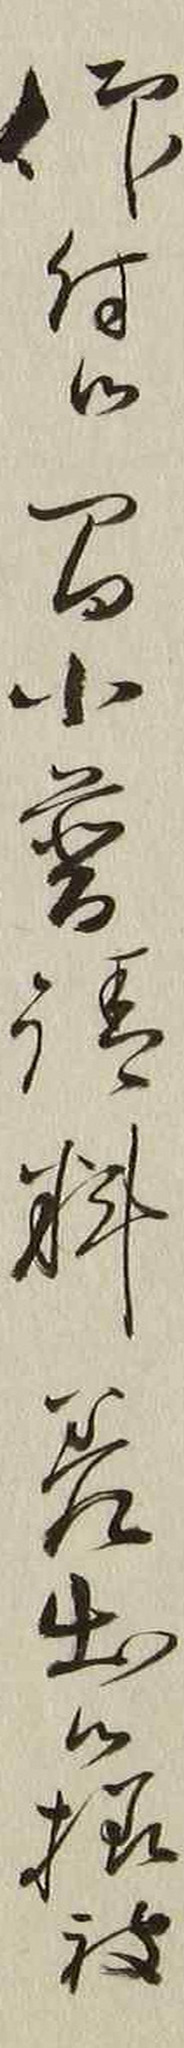仰付候間小普請料差出候様被
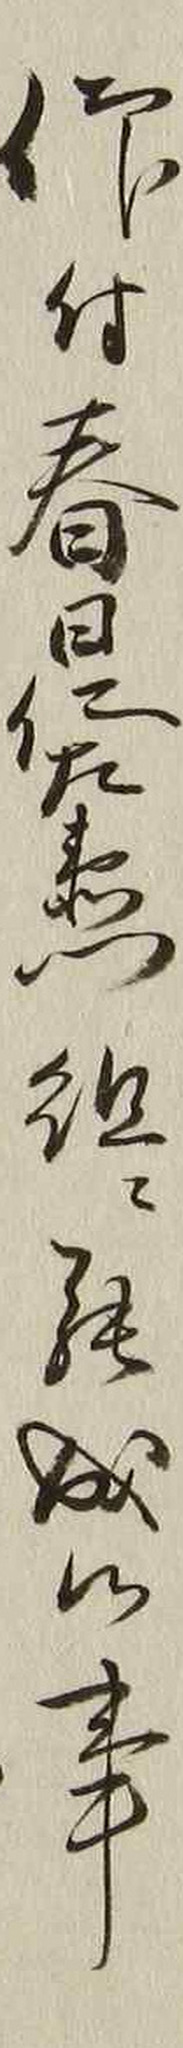仰付春日仁左衛門組ニ罷成候事
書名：諸士系譜　巻之163　な之部5
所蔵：会津若松市立会津図書館
